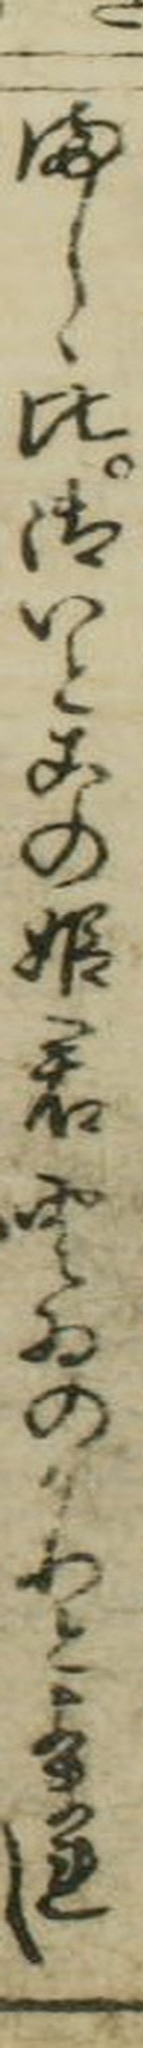ましゝ比。御いとこの姫君雲ゐのかりとよまれし
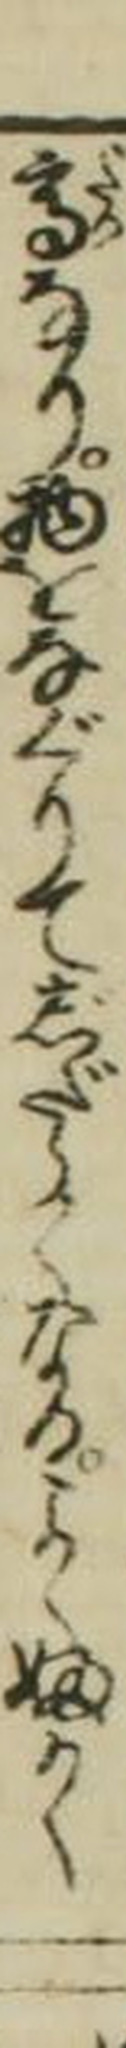高なり。物をなぐりてじだらくなる。よくふかく
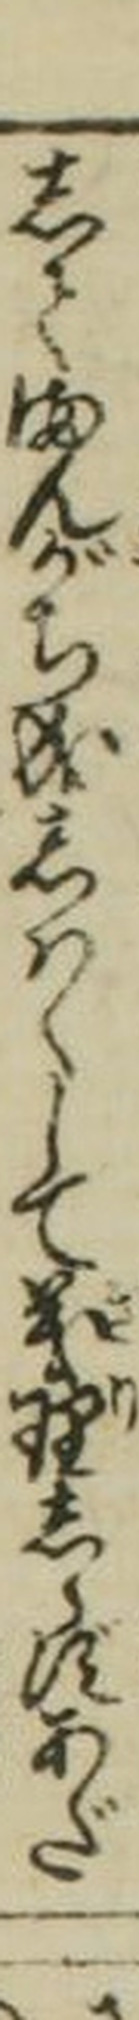してまんがち成しはくして義理しらずあだ
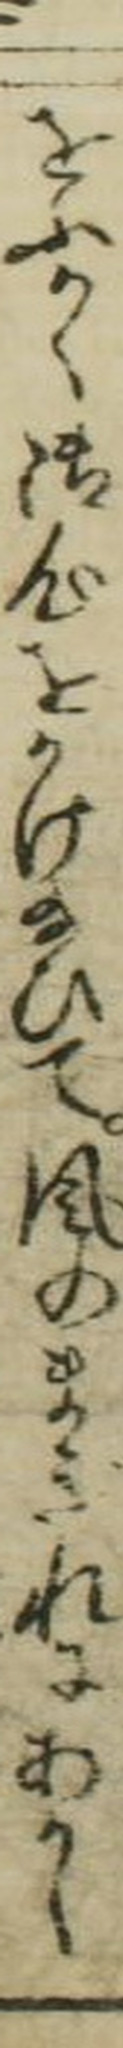をふかく御心をかけ給ひて。風のまぎれにあかし
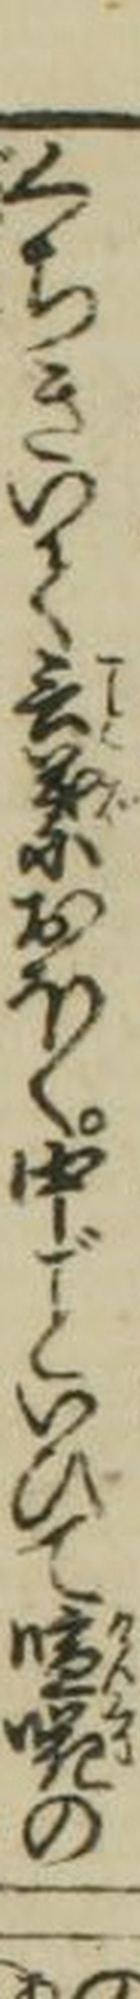くちきいて言葉おほく。中ごといひて喧𠵅の
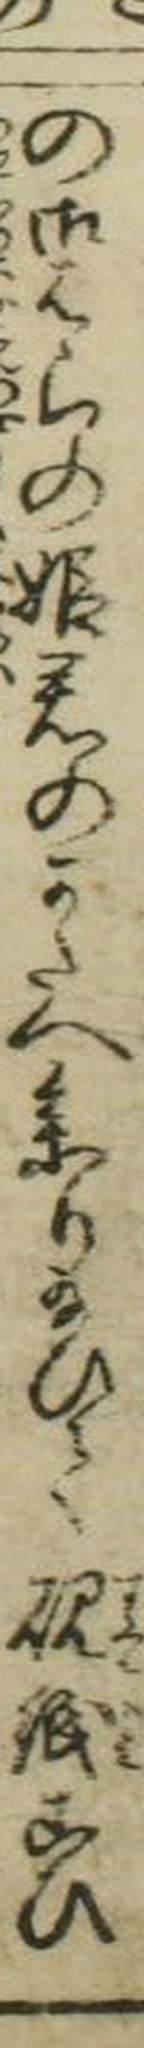の御はらの姫君のかたへ参り給ひて硯紙こひ
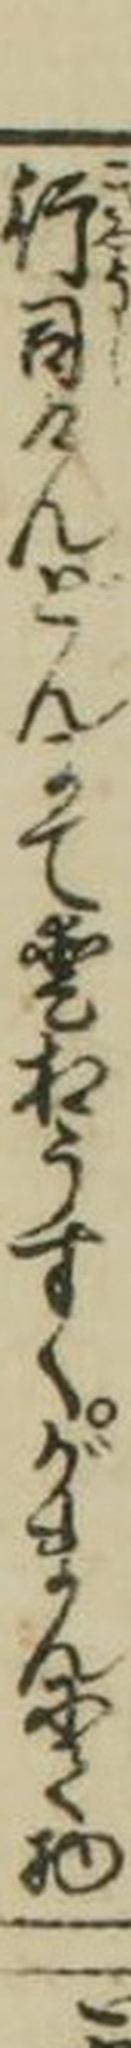行司けんどんにて愛相うすく。がまんにて物
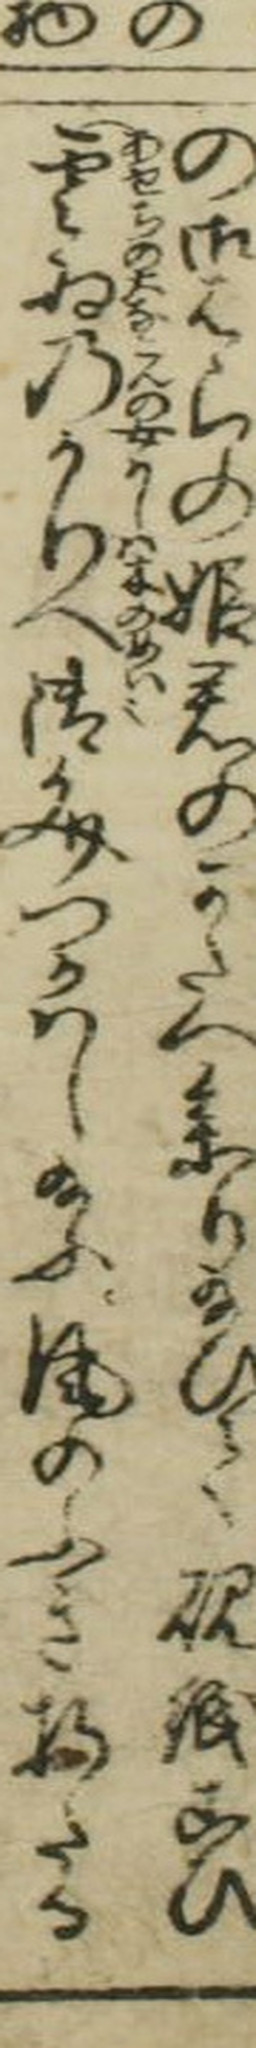雲ゐのかりへ御文つかはし給ふ。風のふき折たる
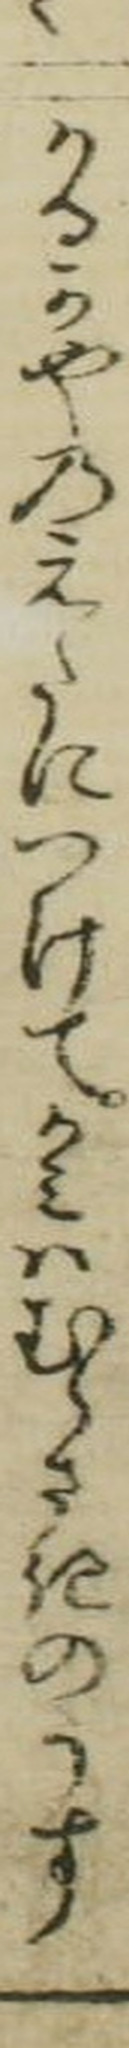かるかやのえたにつけて。かみはむらさきのうす
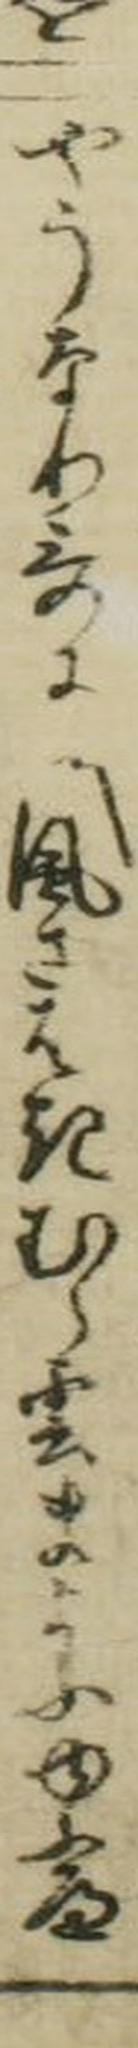やうなり哥に〽風さはきむら雲まよふゆふへ
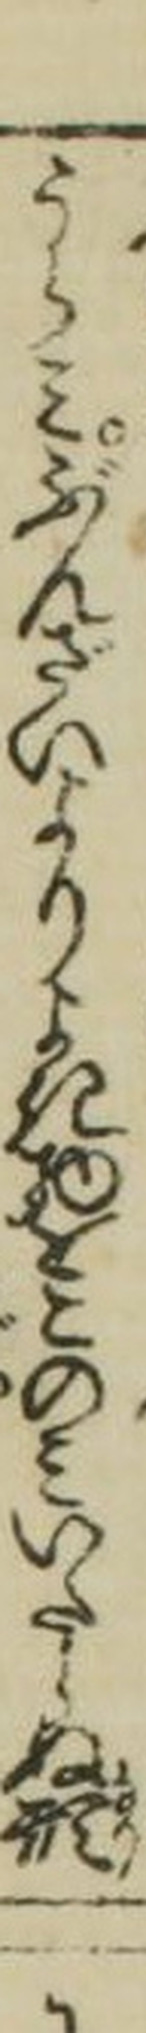うらみ。ぶんざいよりよき物をこのみいたらぬ形
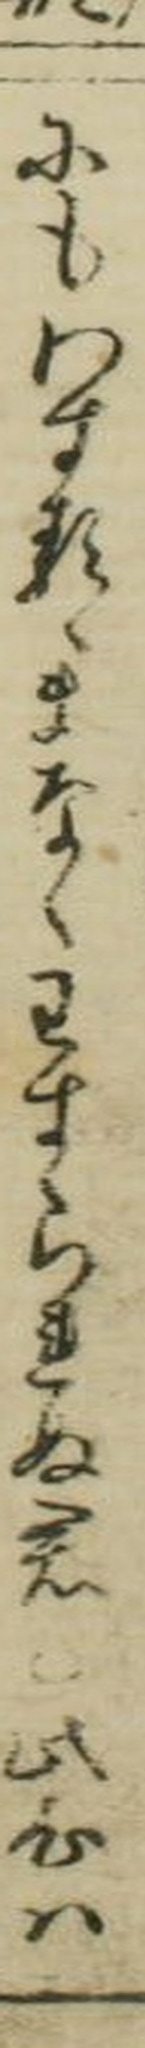にもわするゝまなくわすられぬ君○此心は
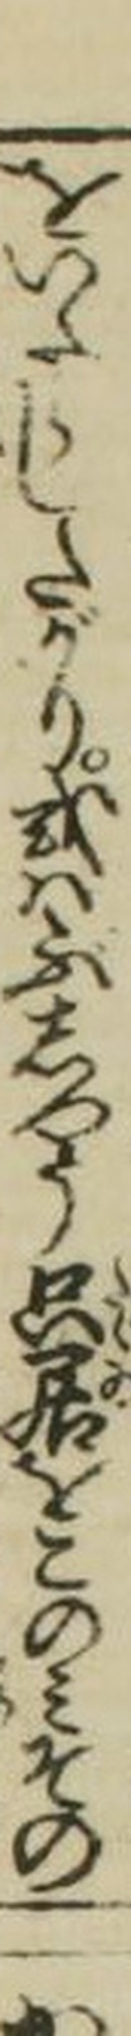をいたらしたがり。或はぶしやう只居をこのみその
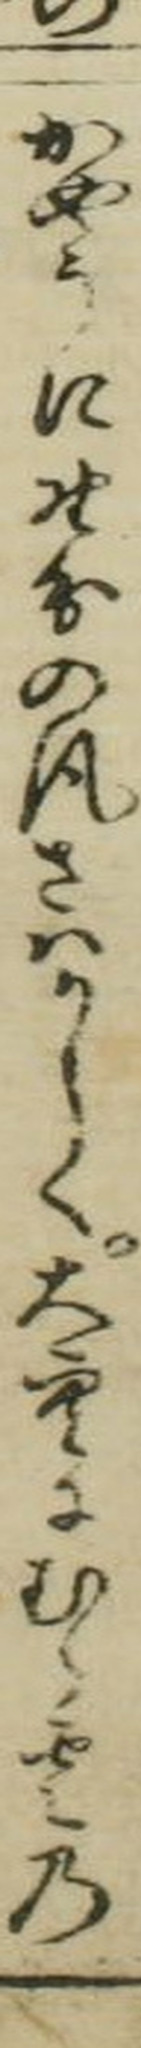かやうに野分の風さはかしく。大空にむら雲の
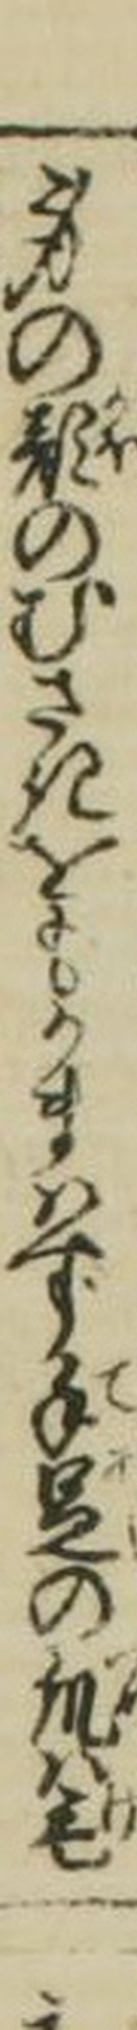身の顔のむさきをもかまはず手足の爪は毛
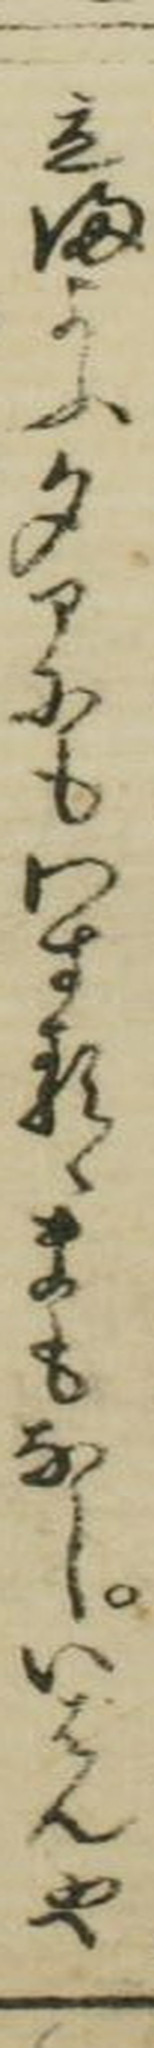立まよふ夕へにもわするゝまもなし。いはんや
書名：女源氏教訓鑑
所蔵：東京学芸大学附属図書館
